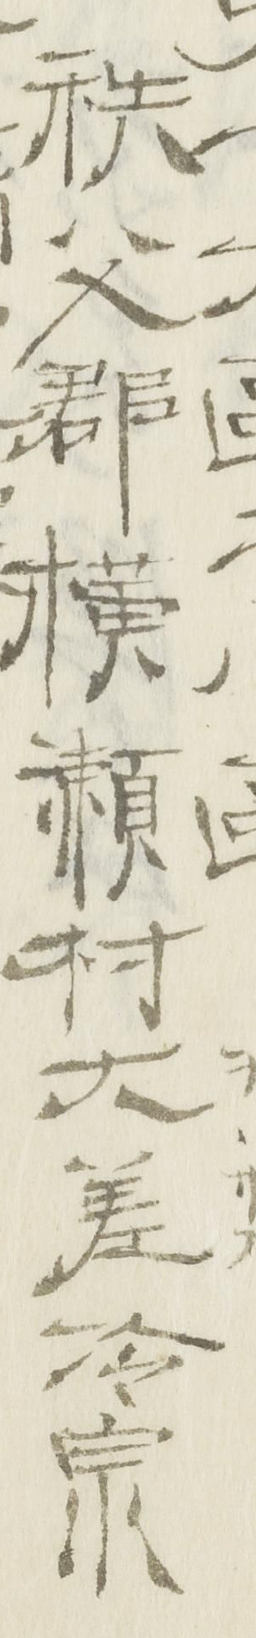秩父郡横瀬村大差冷泉
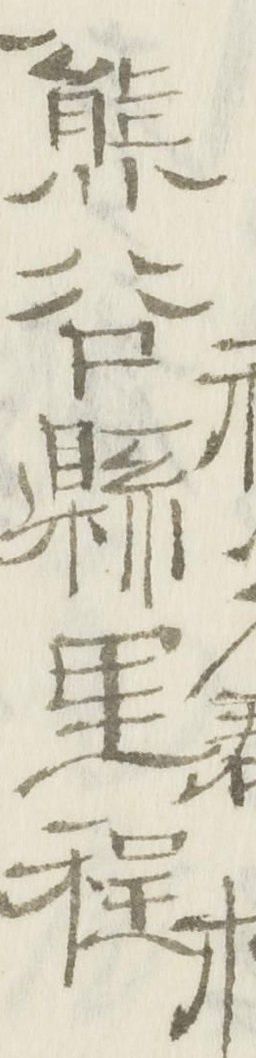熊谷県里程
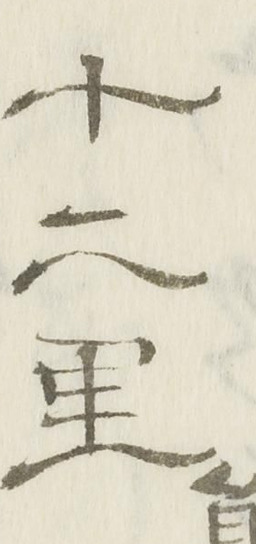十二里
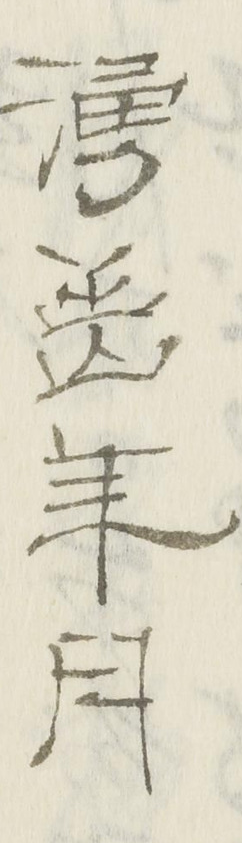湧出年月
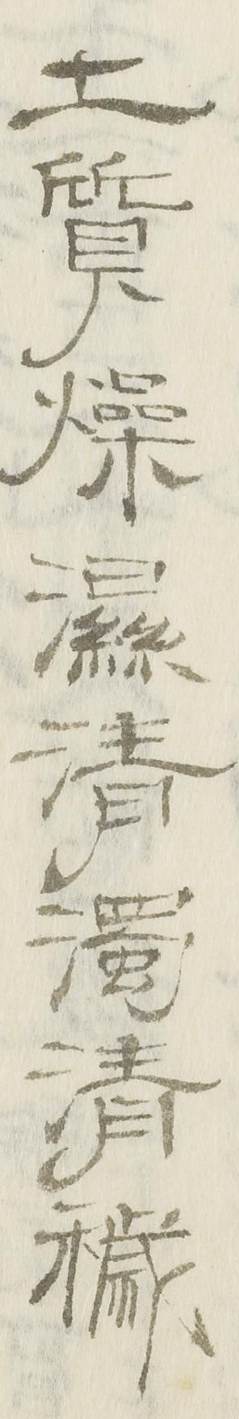土質燥湿清濁清穢
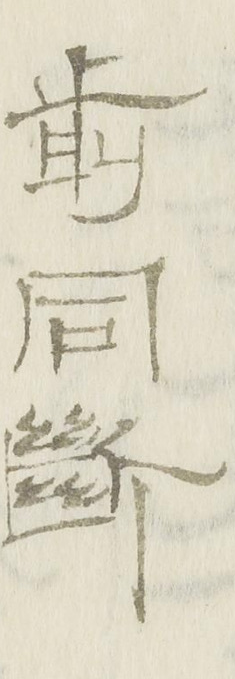前同断

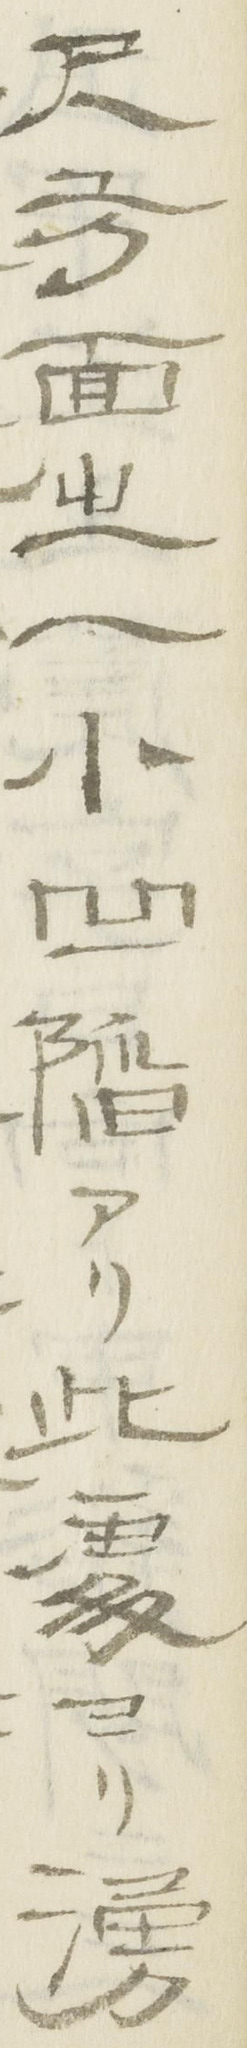沢方面出へ小凹陥アリ此処ヨリ湧
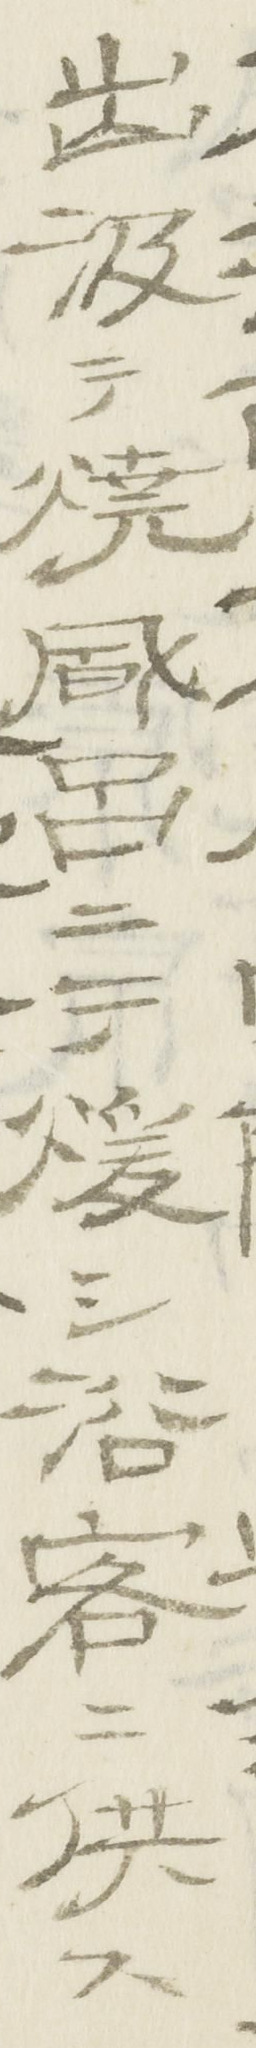出汲テ焼風呂ニテ暖シ浴客ニ供ス
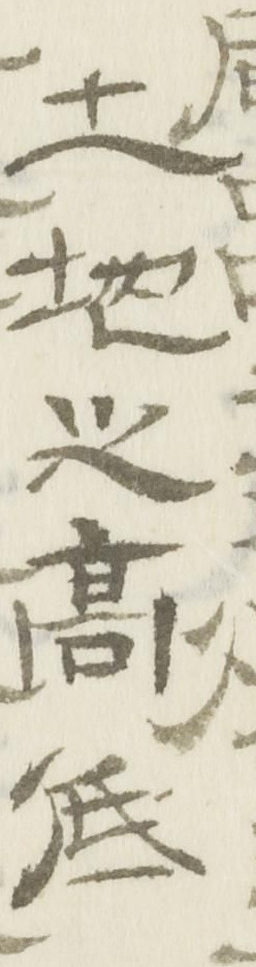土地之高低
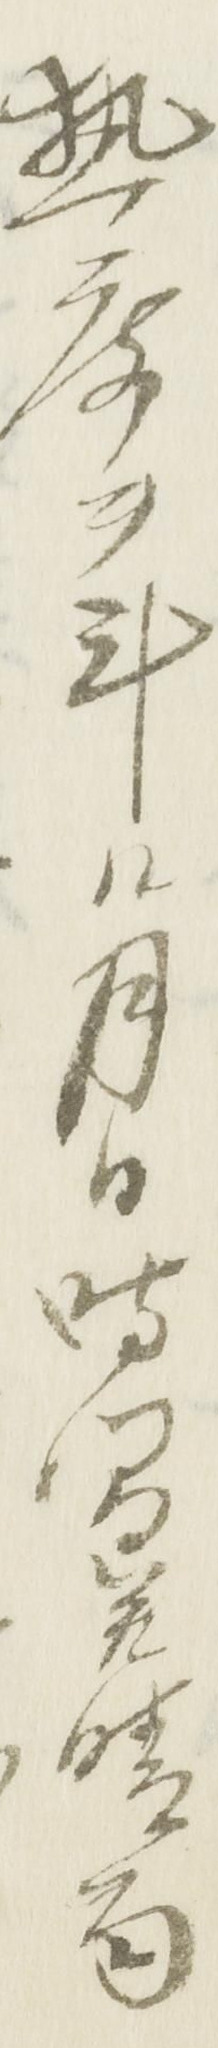熱度ヲ計ル月日時間并晴雨
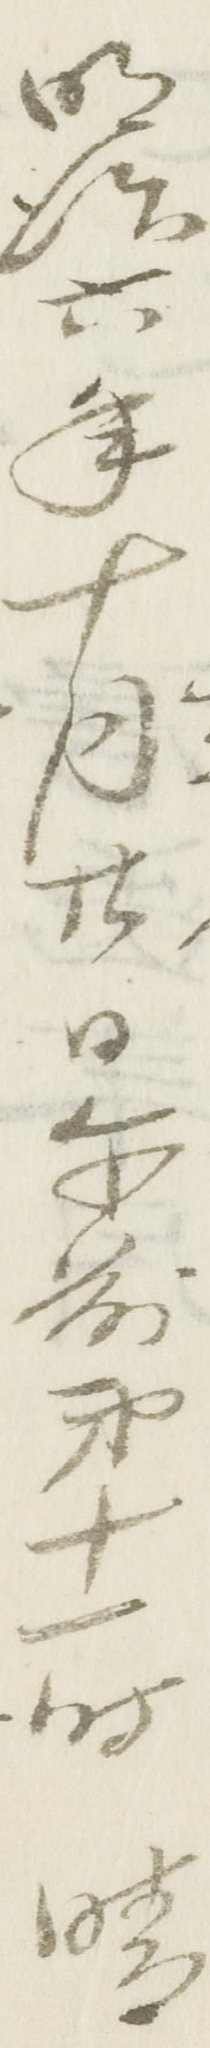明治六年十月廿日午前第十一時晴
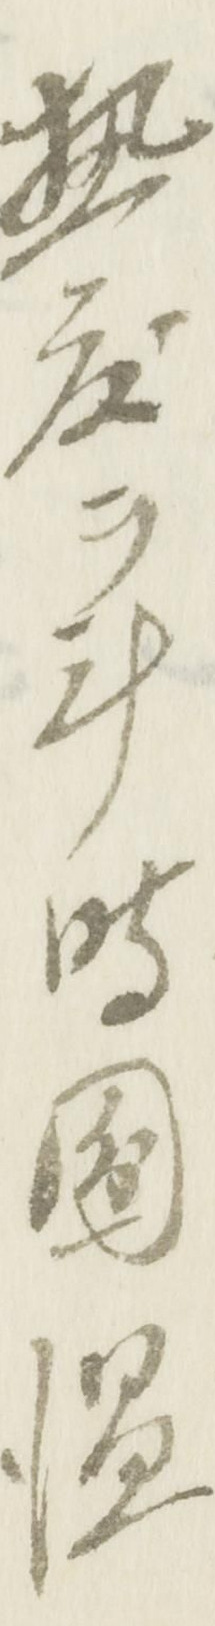熱度ヲ計ル時分温
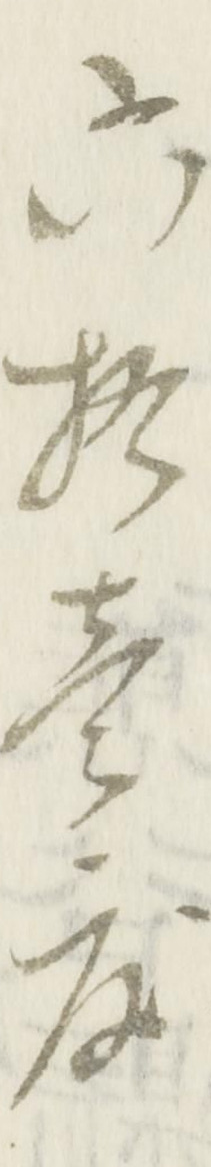六拾壱度
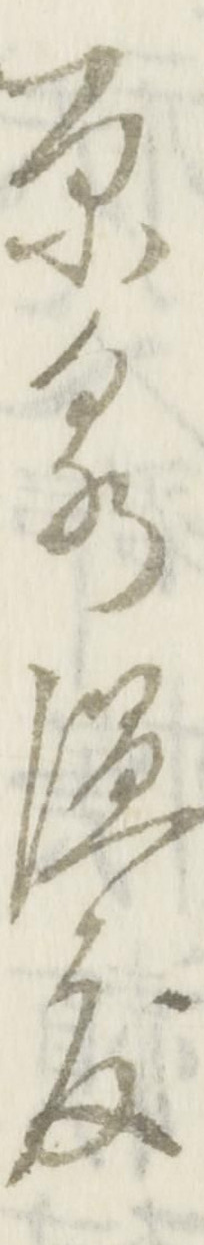原泉温度
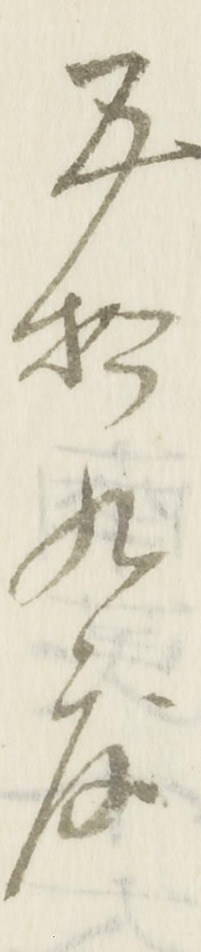五拾九度
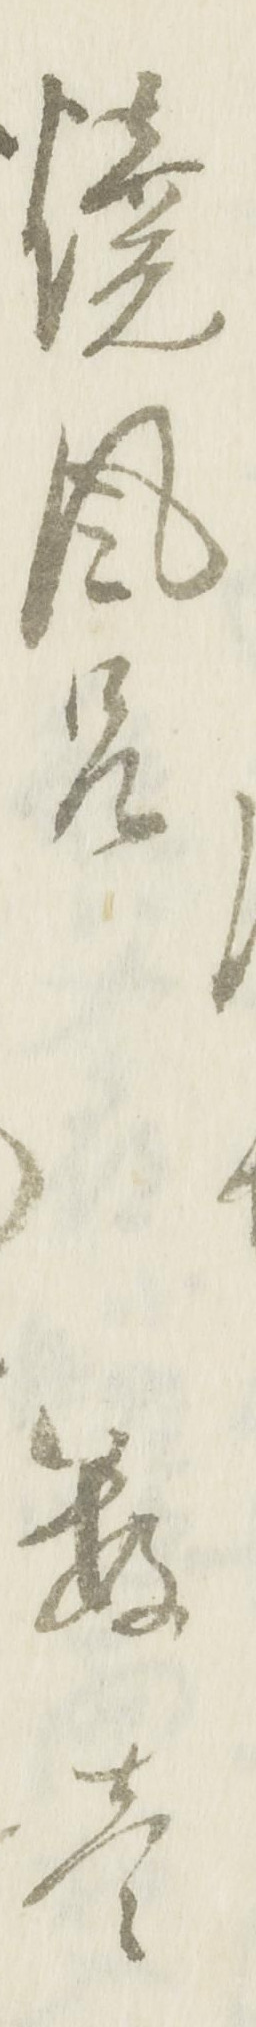焼風呂数壱
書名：温冷泉試験表
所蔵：東京大学地震研究所図書室 Earthquake Research Institute Library, The University of Tokyo, JAPAN
